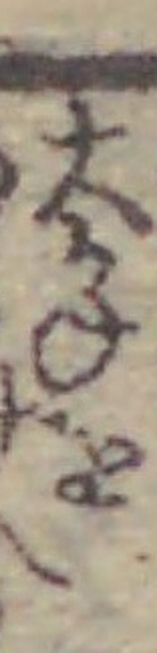大かねを
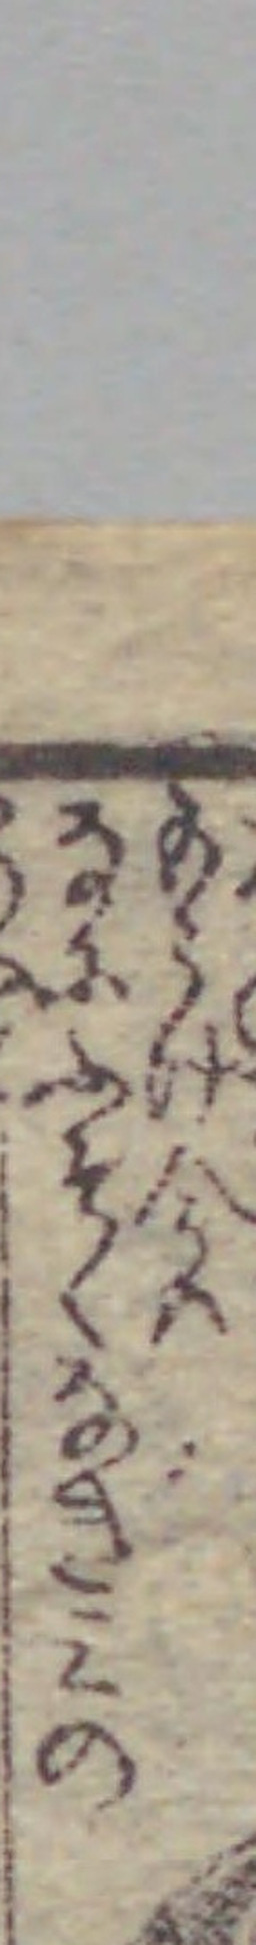なにふそくなきみの
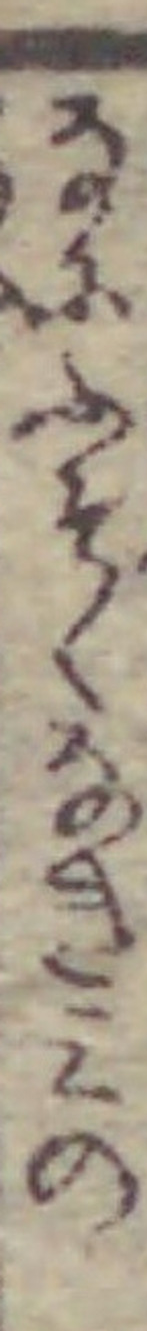なにふそくなきみの
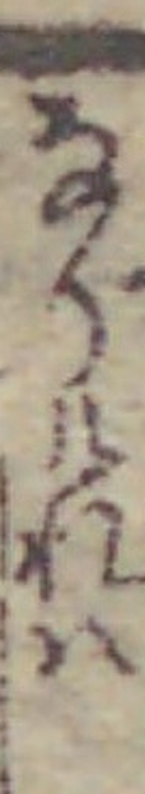なりけれは
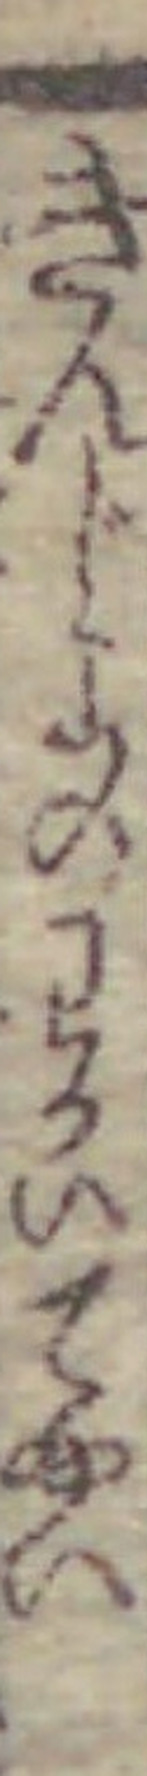きんじよのわかいてやい
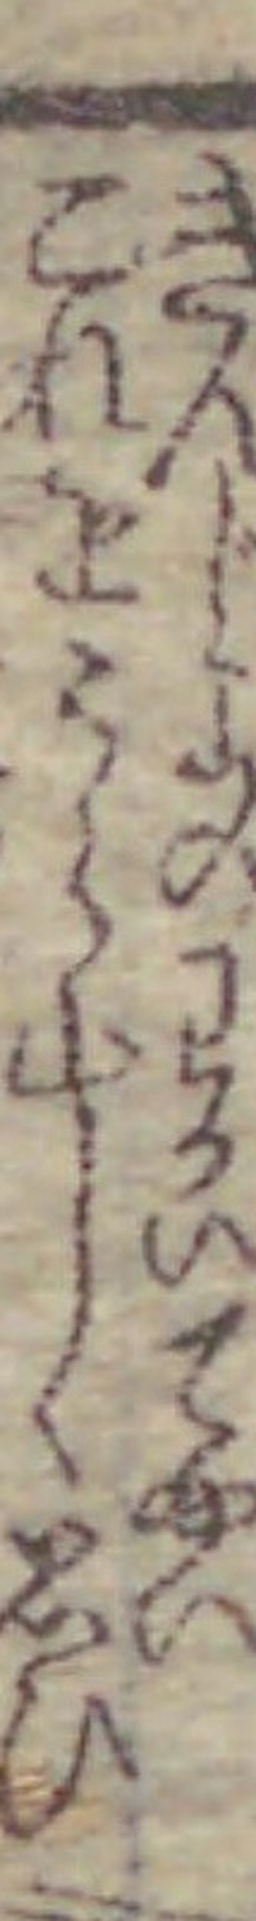これをうら山しくう思ひ
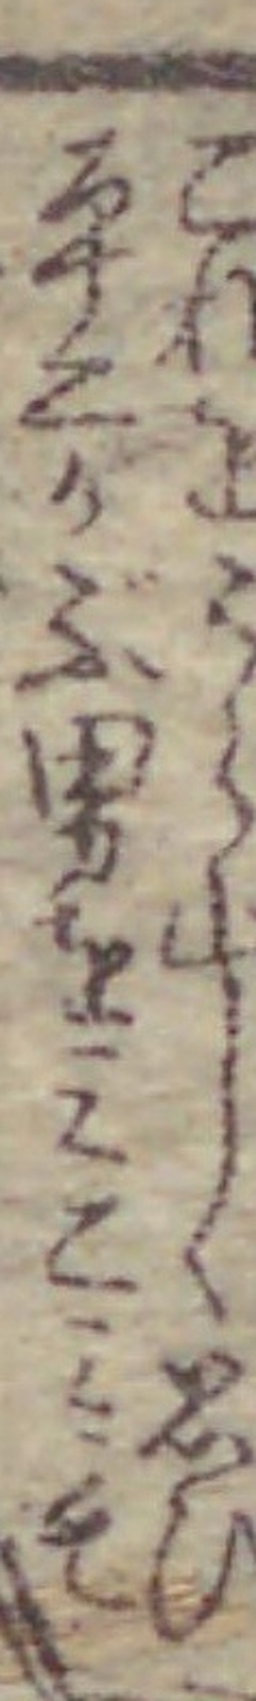平二がぶ男をみこみて
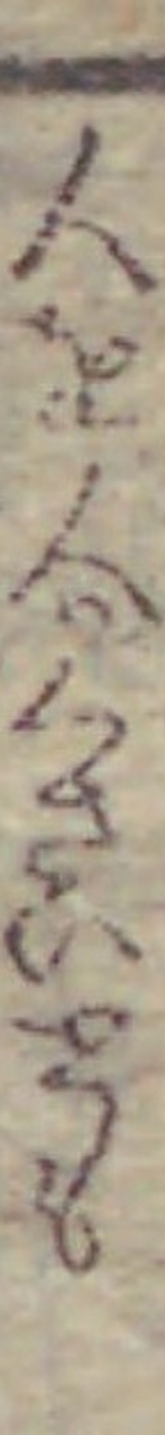人を人ッくさいとも
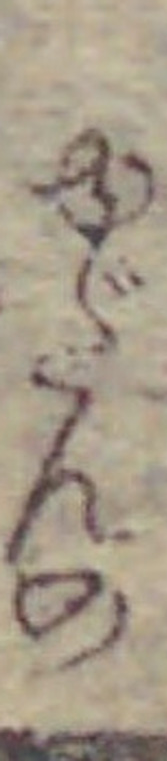ゆだんの
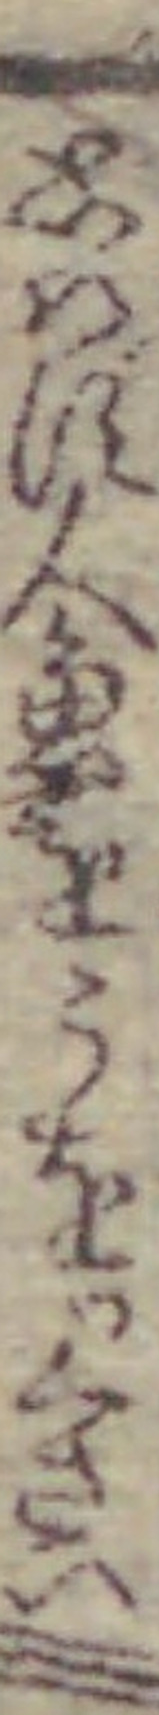思はず人魚をうをッくさい
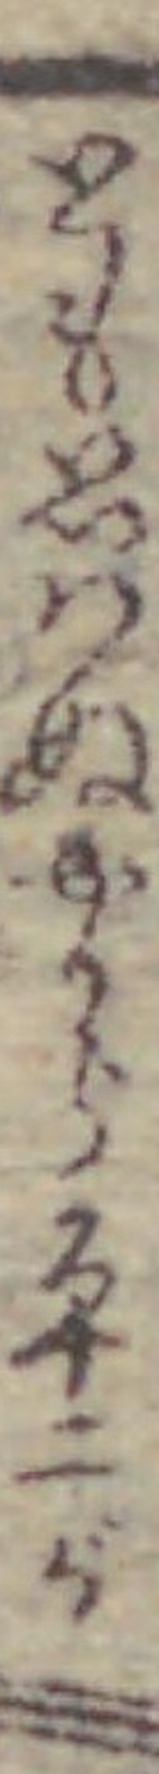とも思はぬやから平二が
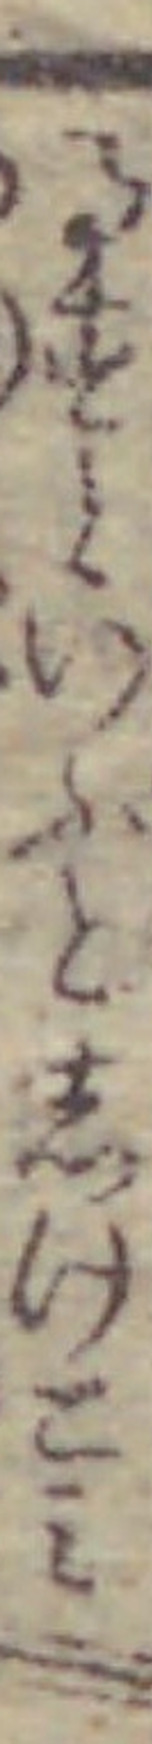るすといふとしけこみ
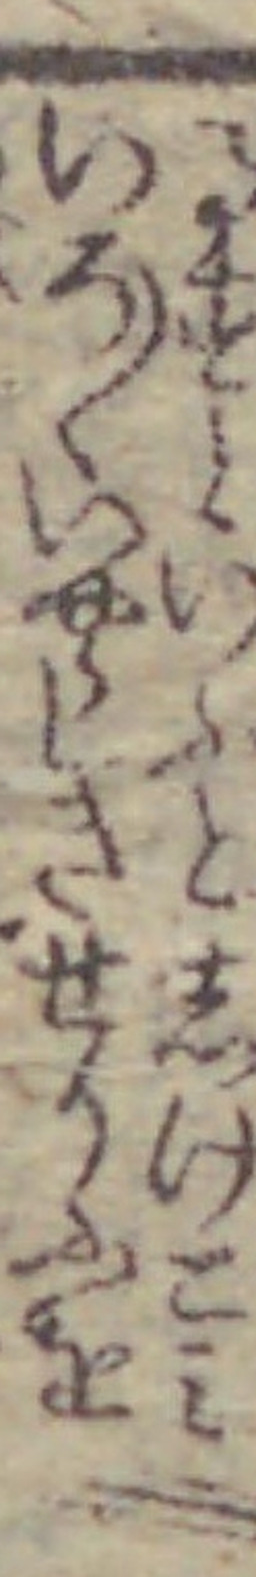いろ〳〵いやらしきせいふを
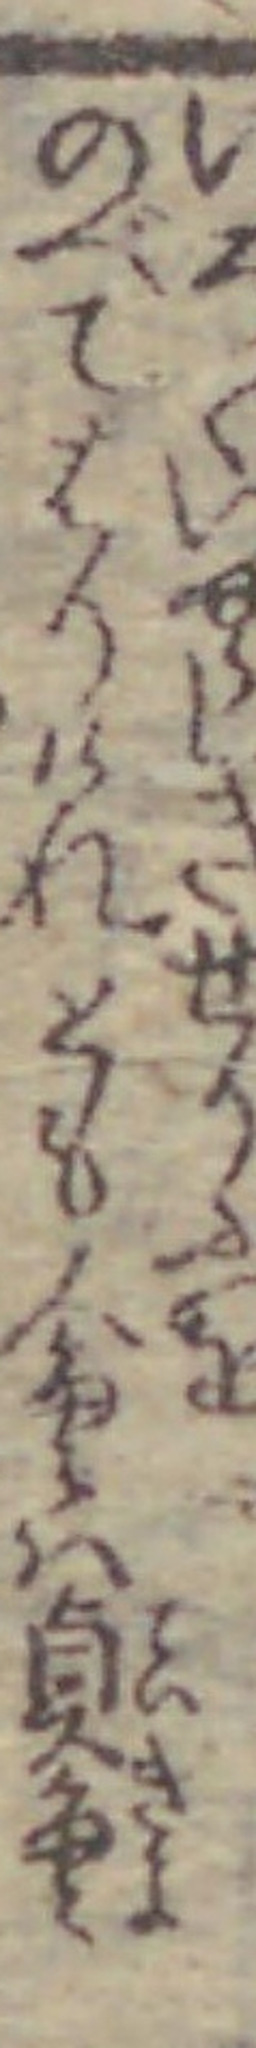のべてはりけれとも人魚は貞魚
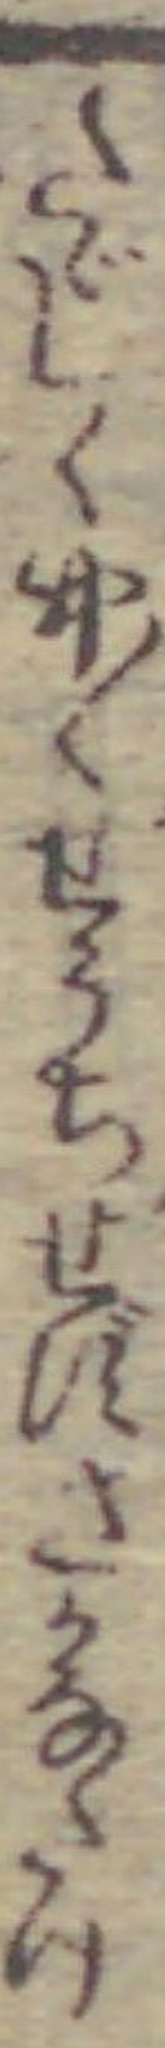たゞしく中〳〵せうちせずさかなたけ
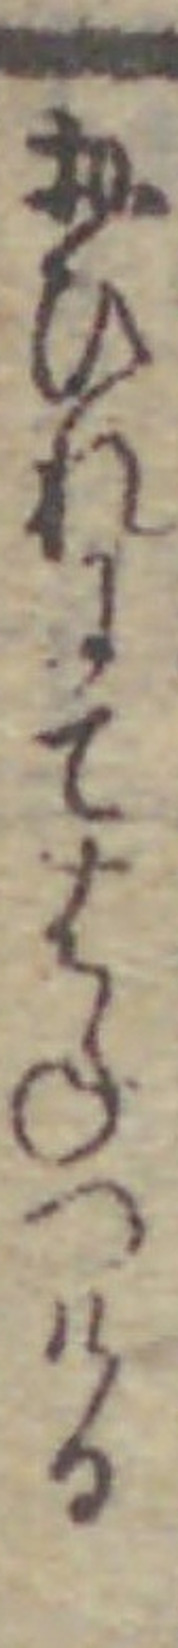おひれにてはねつける
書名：箱入娘面屋人魚 3巻
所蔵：国立国会図書館 National Diet Library, JAPAN
